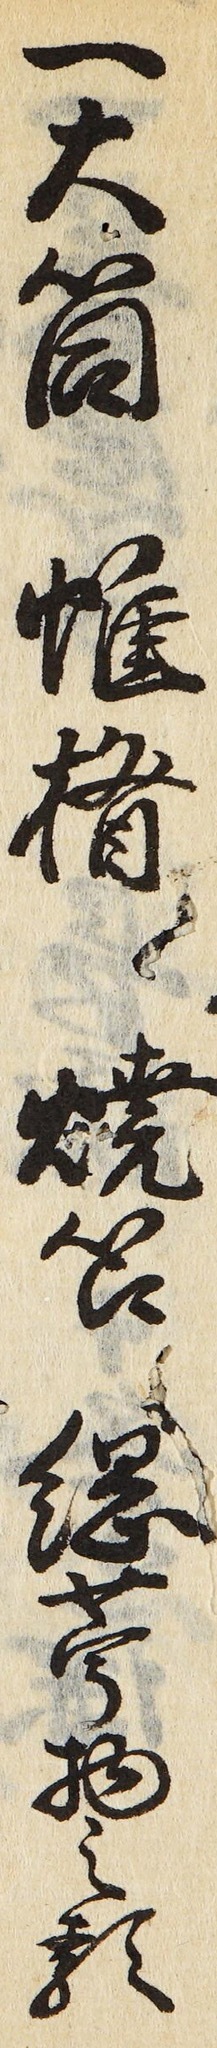一大筒帷焼綱苧物之類
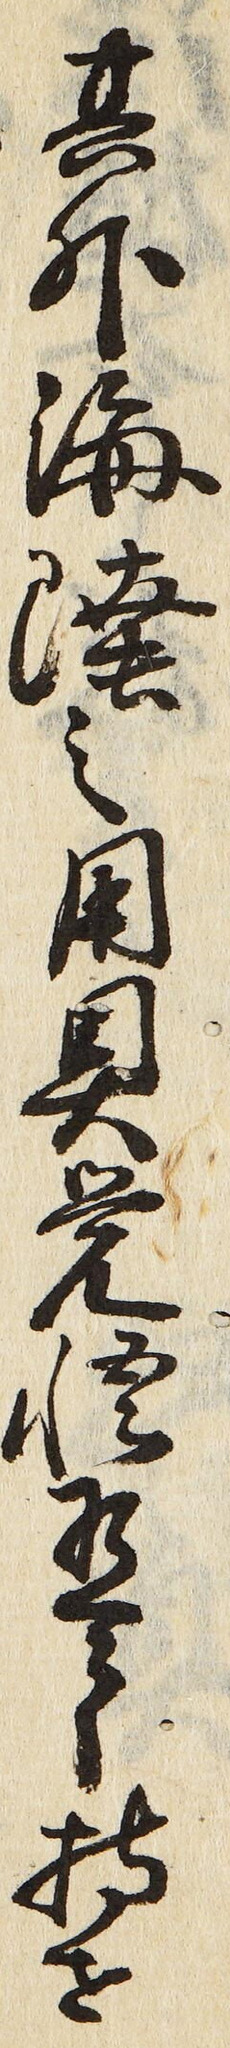其外海陸之用具覚悟有之持せ
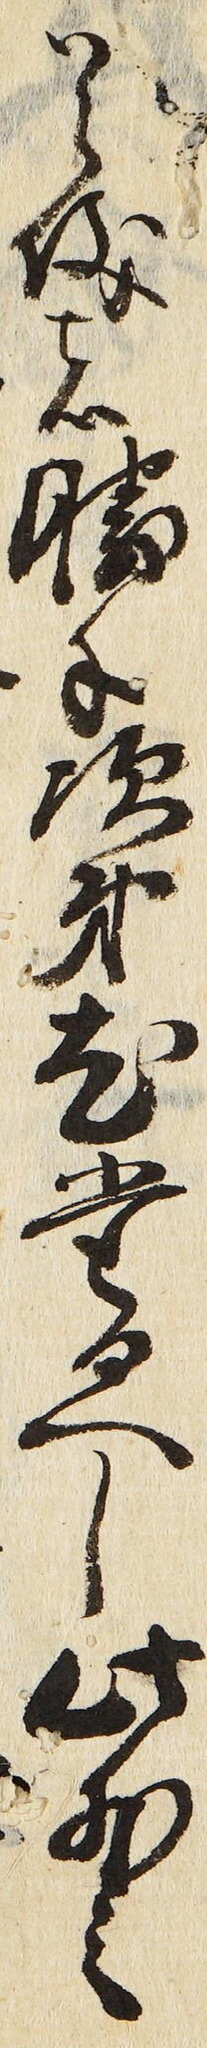候儀者勝手次第尤たるへし此外之
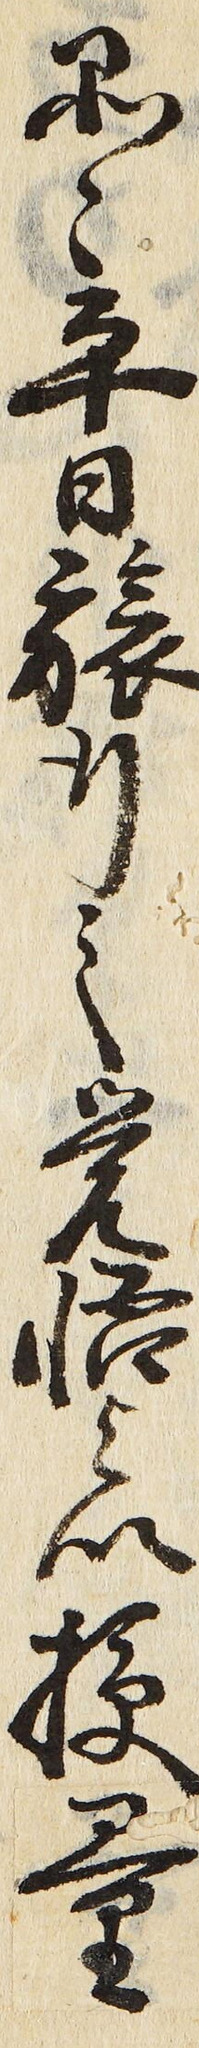品々平日旅行之覚悟与以授量
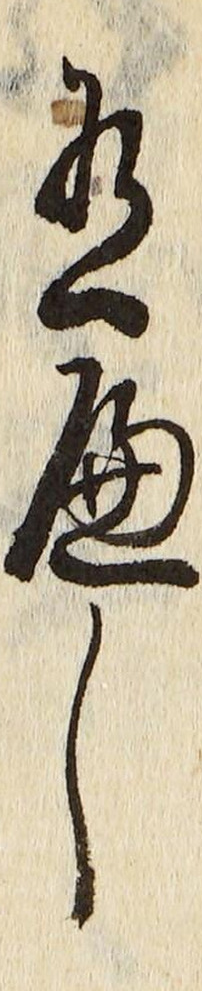有へし
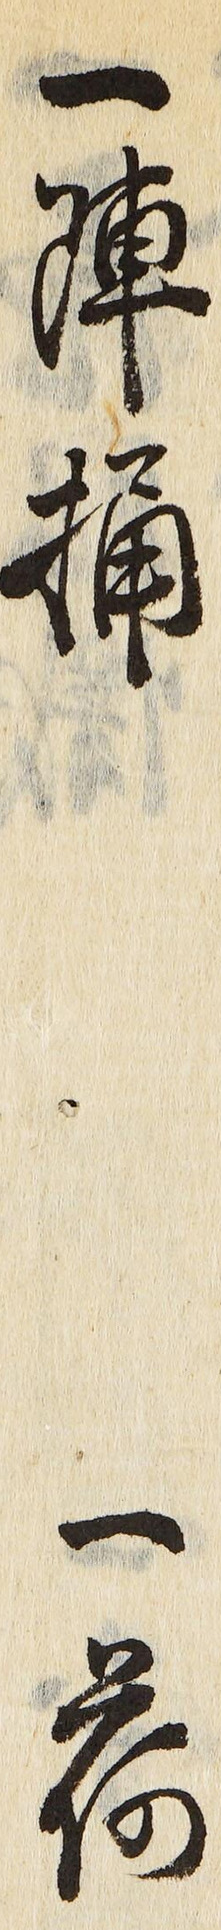一陣桶一荷
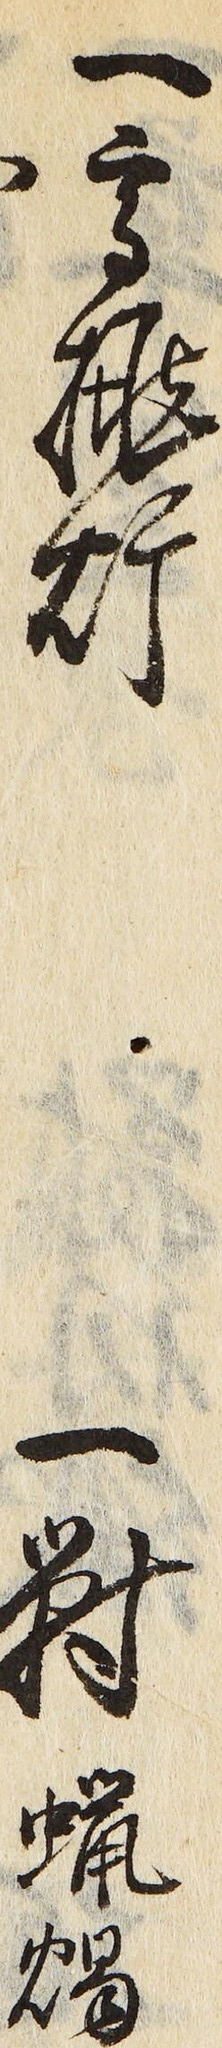一高挑灯一対蝋燭
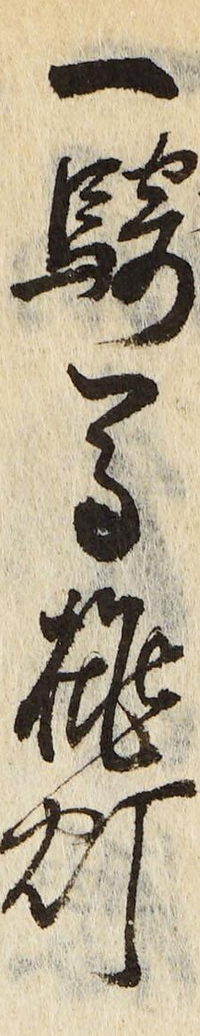一騎馬挑灯
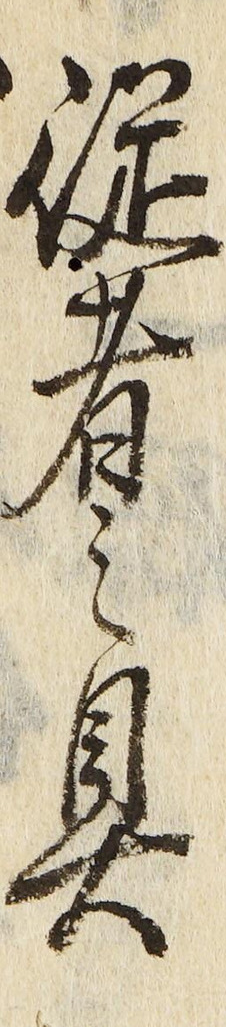従者之具
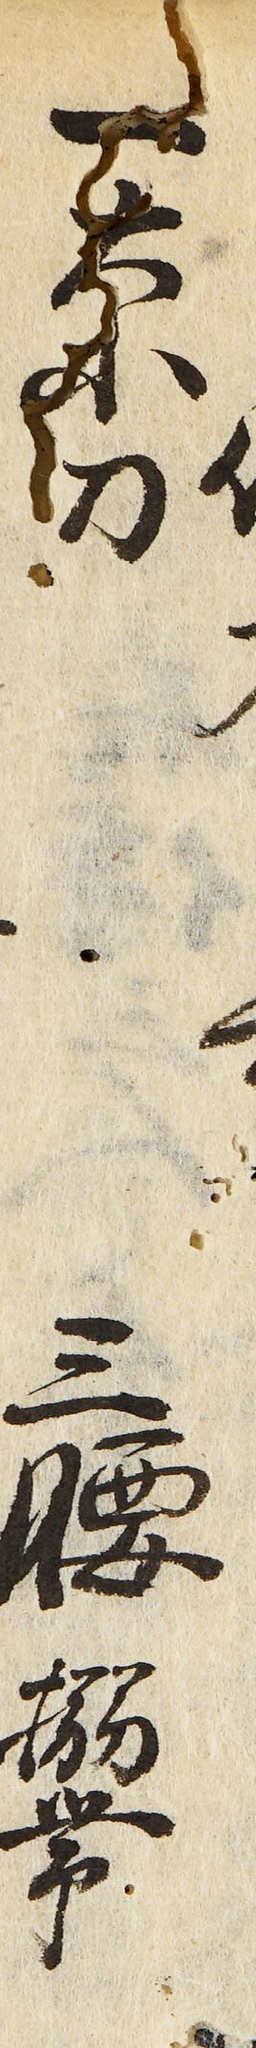一大小刀三腰搦帯
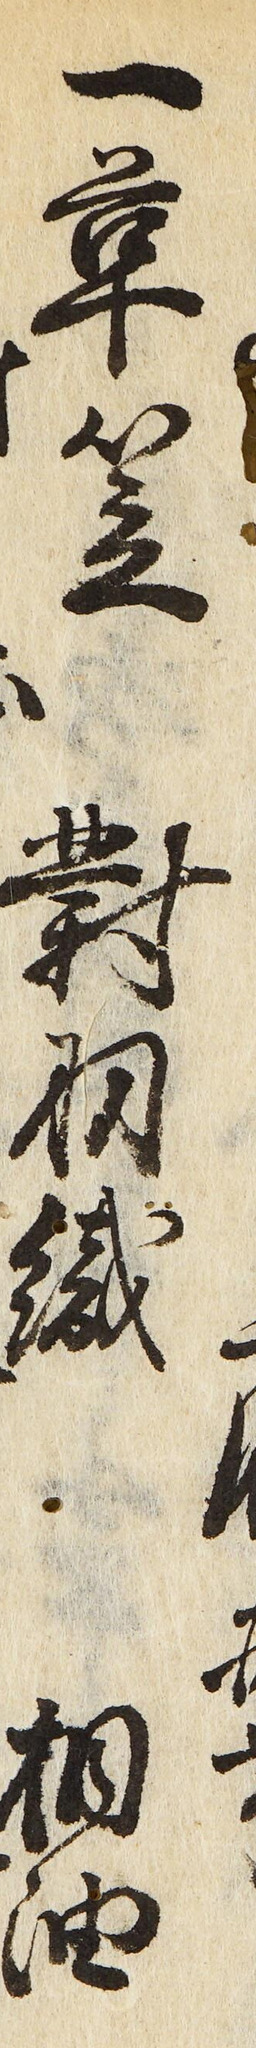一革笠対羽織桐油
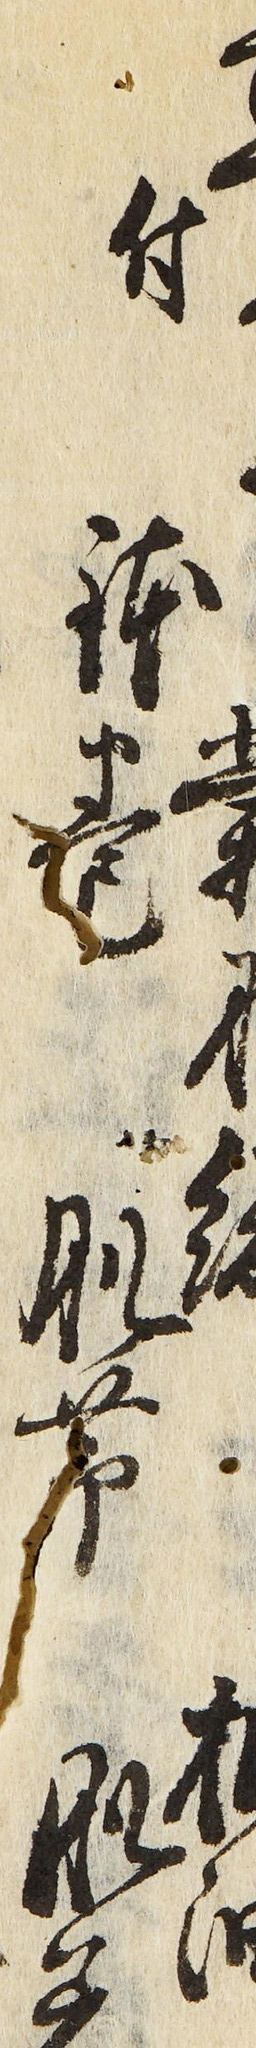付鉢巻肌帯肌着
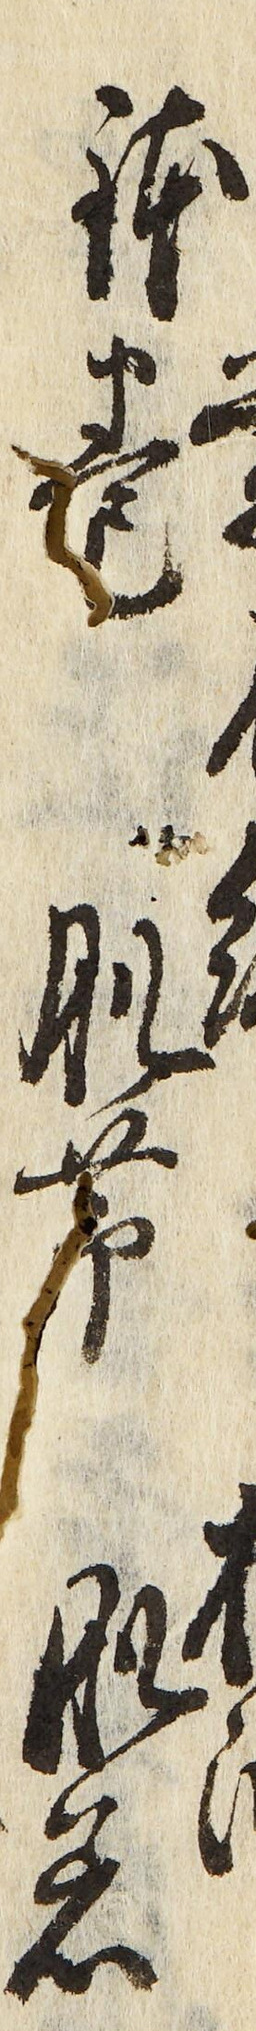付鉢巻肌帯肌着
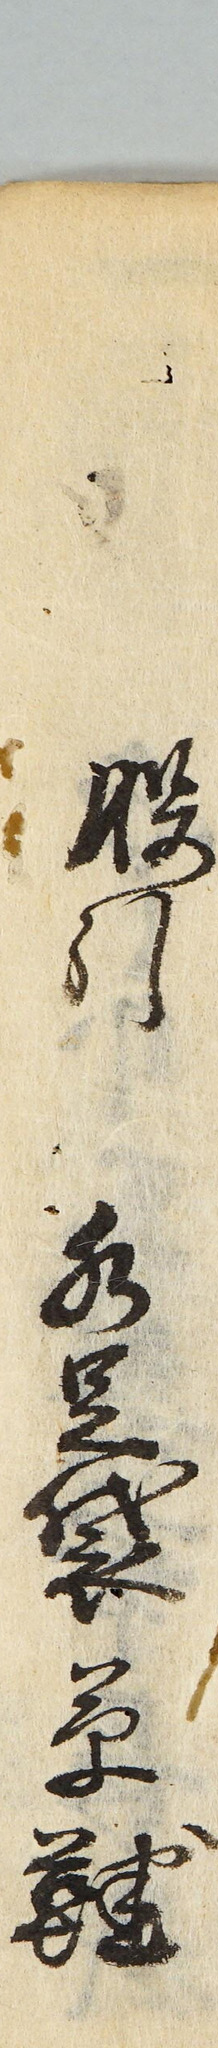股引水足袋草鞋
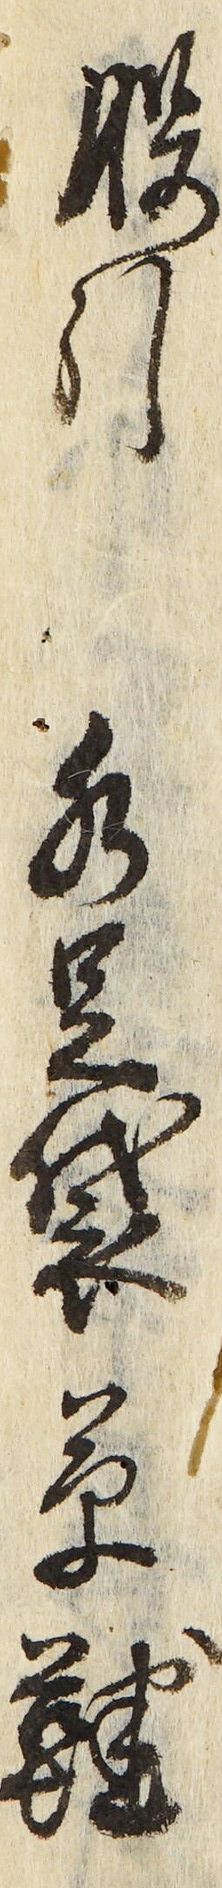股引水足袋草鞋

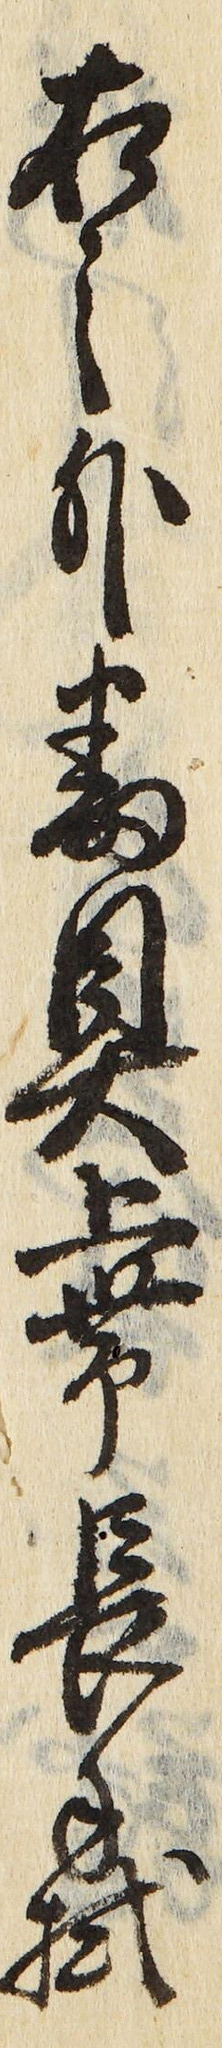右之外番具上帯長手拭
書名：御領海江異国船漂流有之節御手当之次第大組頭心得之廉々書集記
